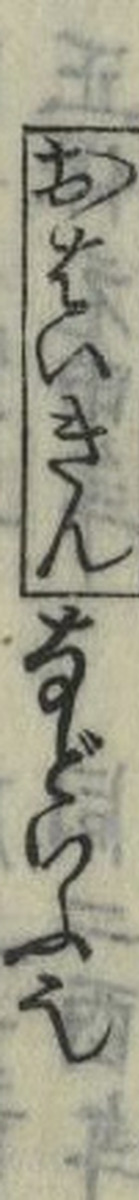[おはいきん]などいふ也

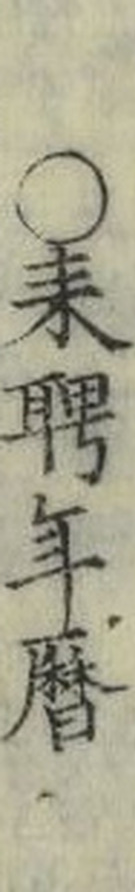〇来聘年曆
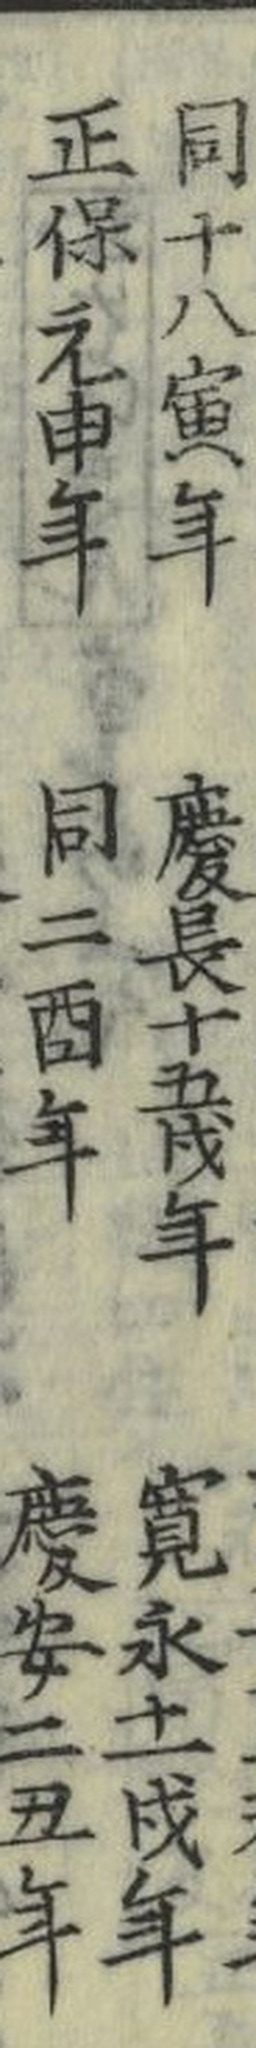正保元申年同二酉年慶安二丑年
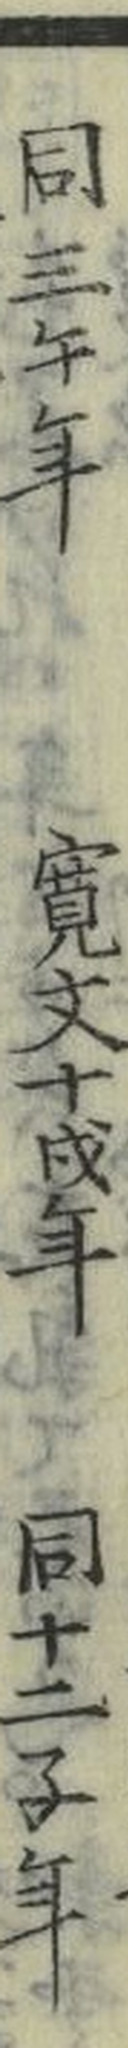同三午年寛文十戌年同十二子年
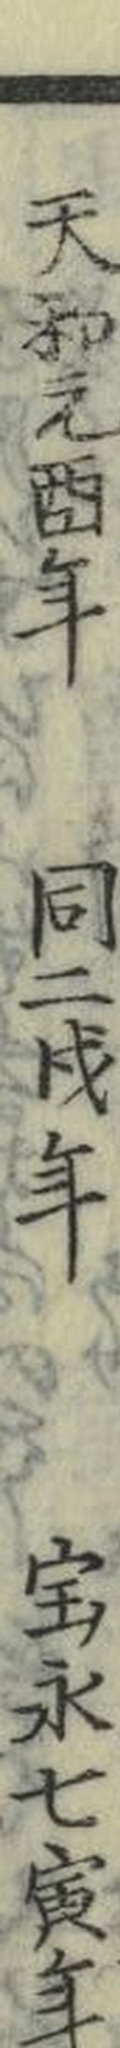天和元酉年同二戌年宝永七寅年
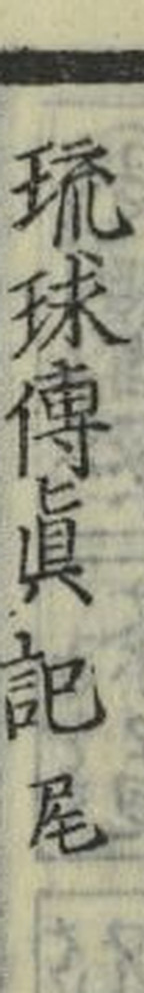琉球傳眞記尾
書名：琉球奇譚
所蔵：University of the Ryukyus Library
